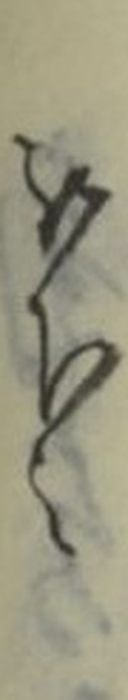被下之
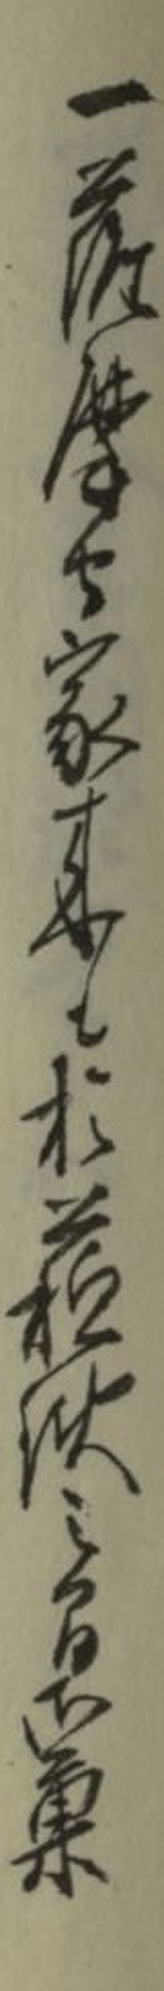一薩摩守家来も於蘇鉄之間御菓
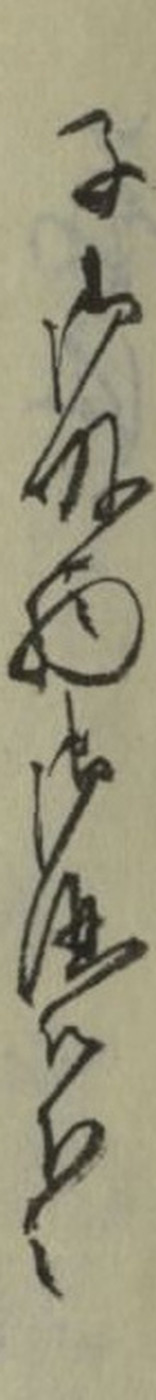子御吸物御酒被下之
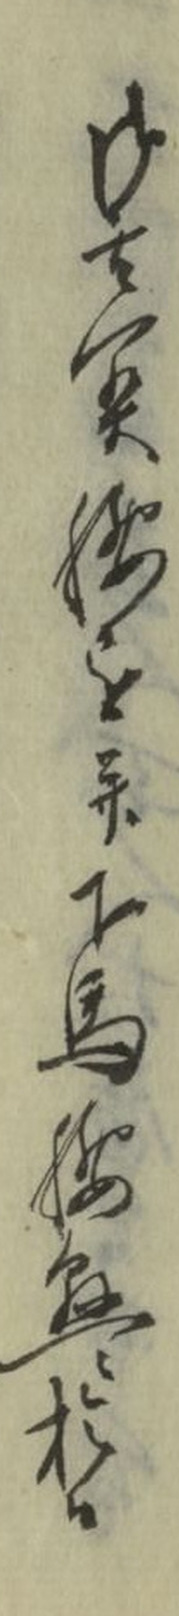御玄関腰懸幷下馬腰懸に於而
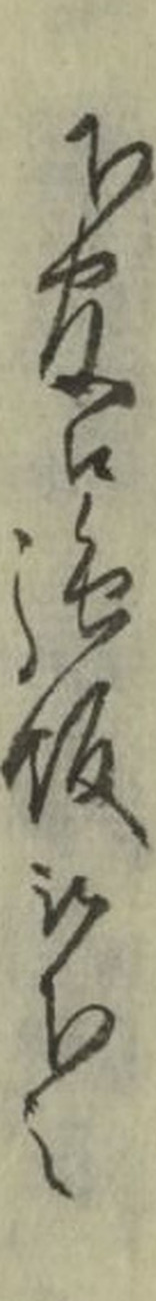下官え強飯被下之
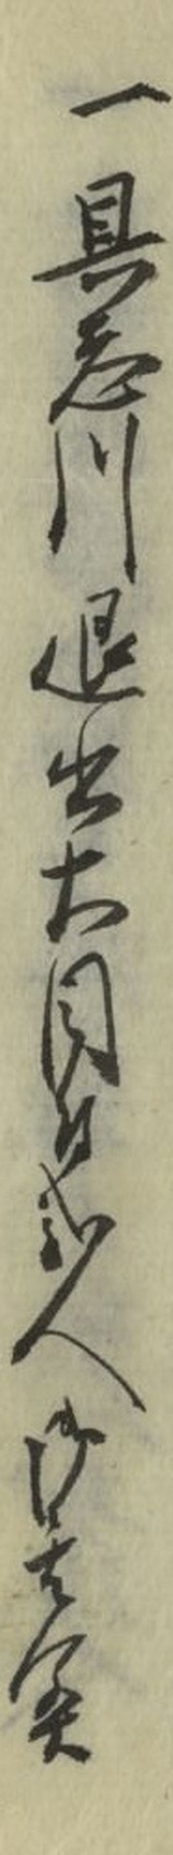一具志川退出大目付弐人御玄関
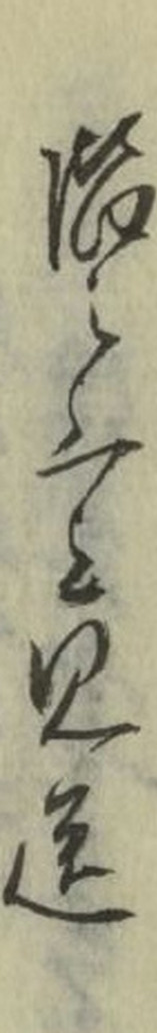階之上迄見送

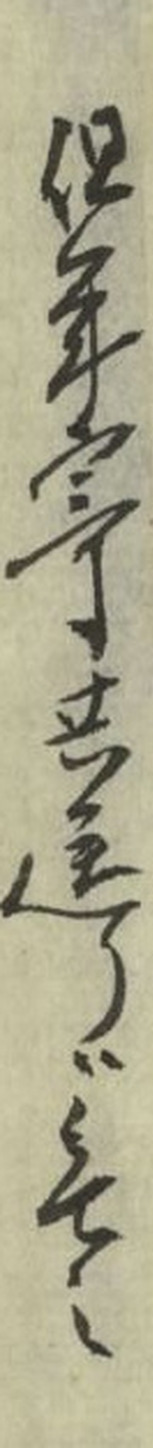但年寄共送りは無之
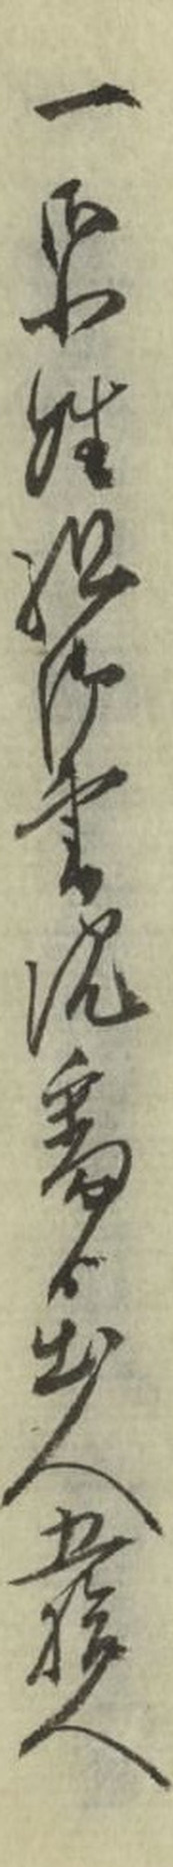一御小姓組御書院番ゟ出人五拾人
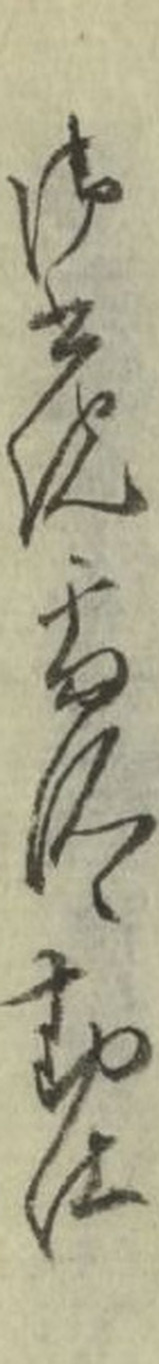御書院番所へ勤仕
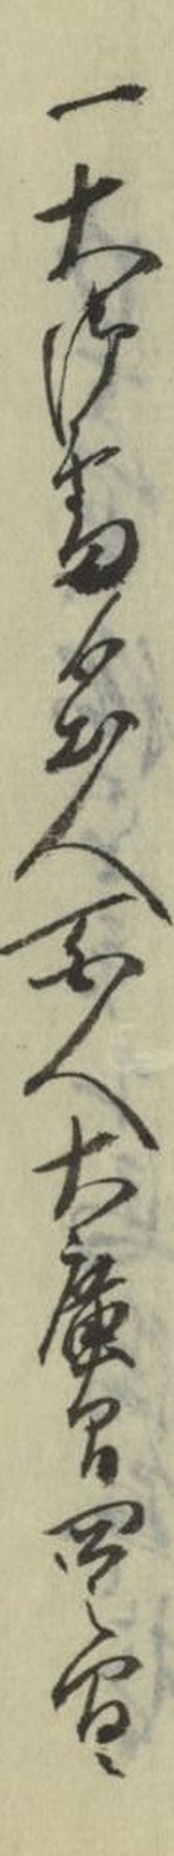一大御番ゟ人出人百人大広間四之間に
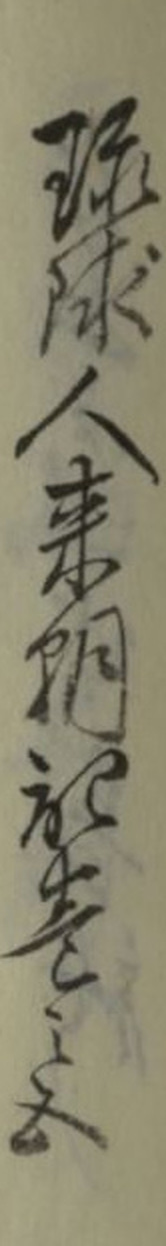琉球人来朝記巻之五
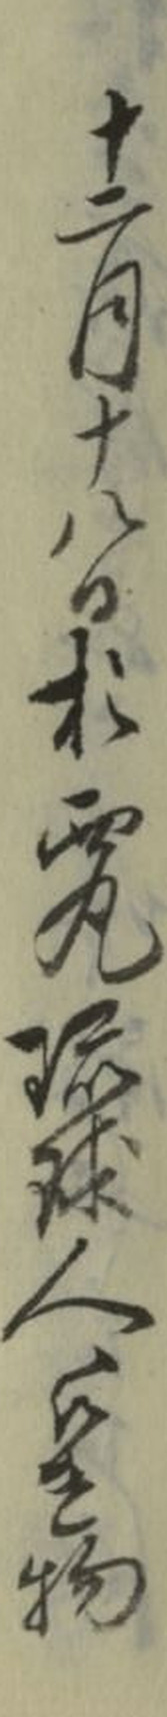十二月十八日於西丸琉球人へ被遣物
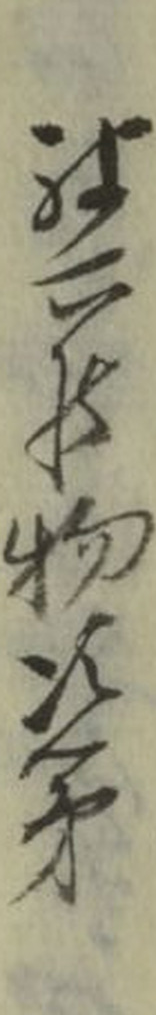被下候物次第
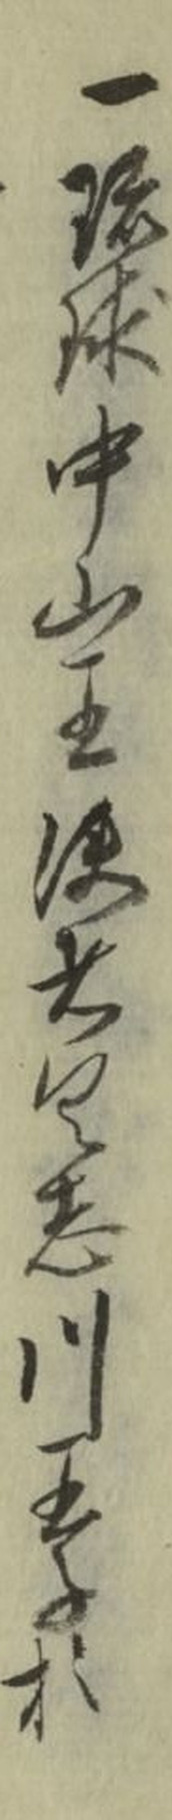一琉球中山王使者具志川王子於
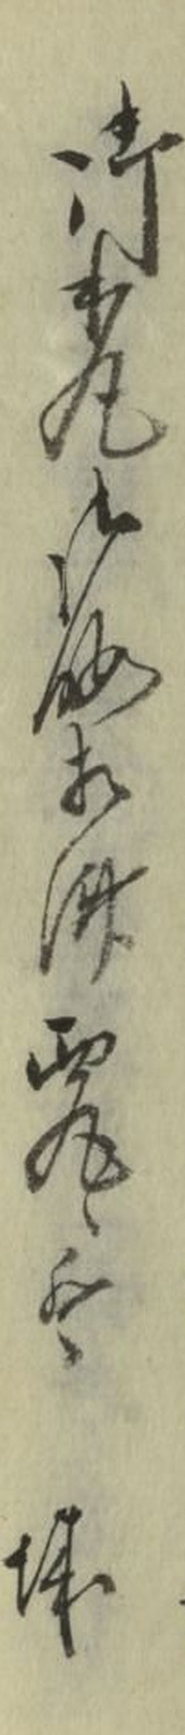御本丸御暇相済西丸へ登城
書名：琉球人来朝記 四之五
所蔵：University of the Ryukyus Library
